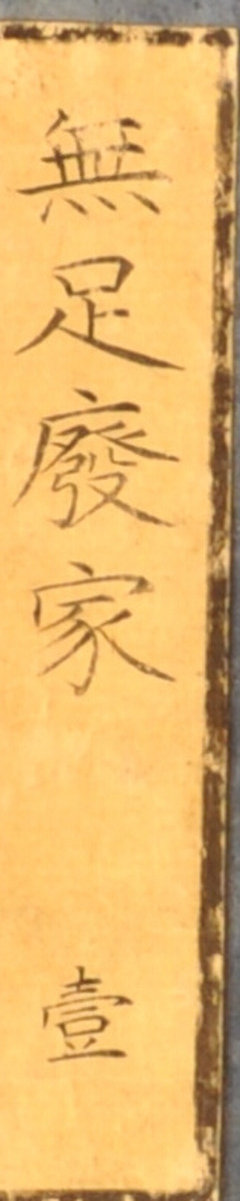無足廃家壱

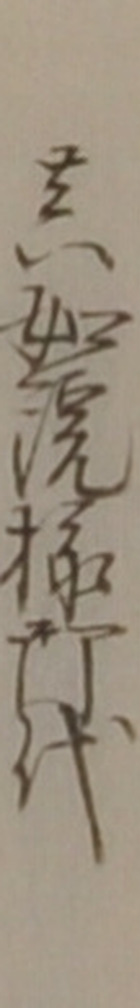真如院様御代
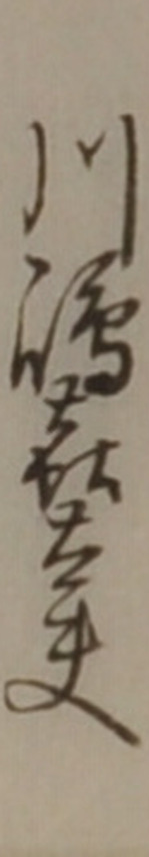川嶋喜太夫
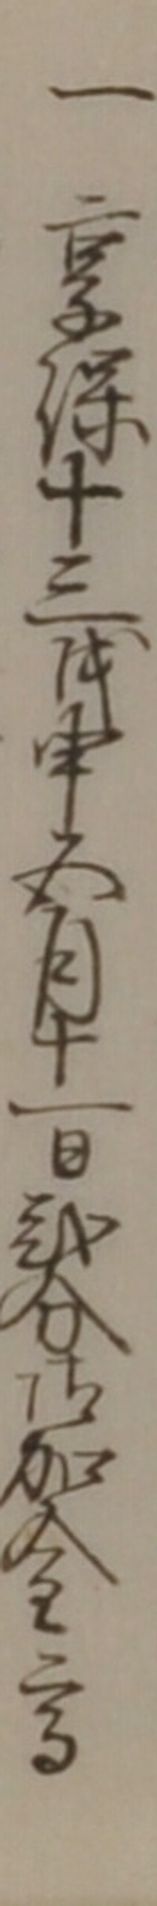一享保十三戊申五月十一日弐分御加金高
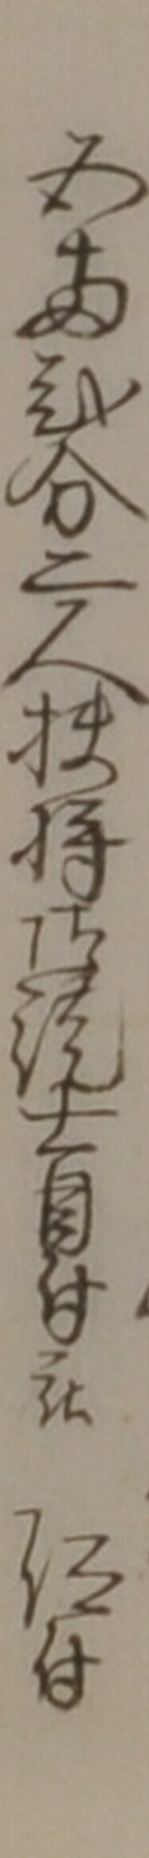五両弐分二人扶持御徒士目付被仰付
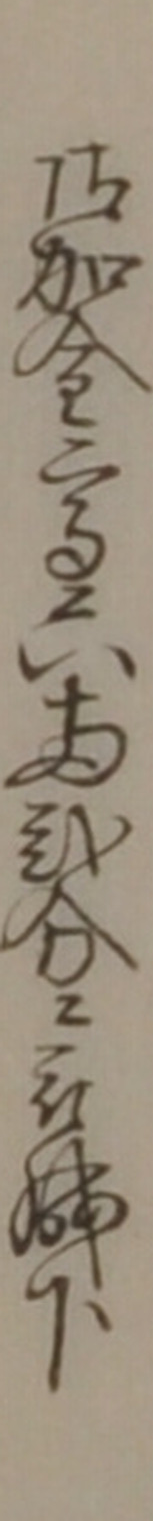御加金高六両弐分ニ被成下
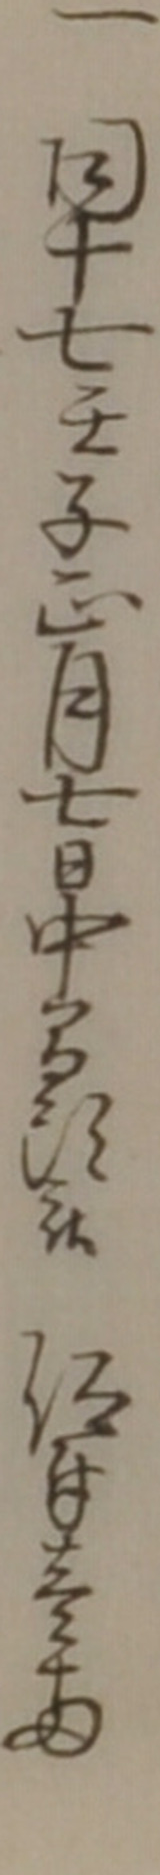一同十七壬子正月七日中間頭被仰付壱両
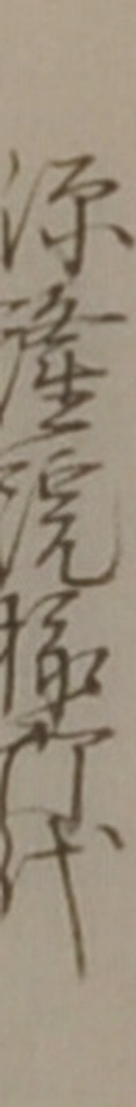源隆院様御代
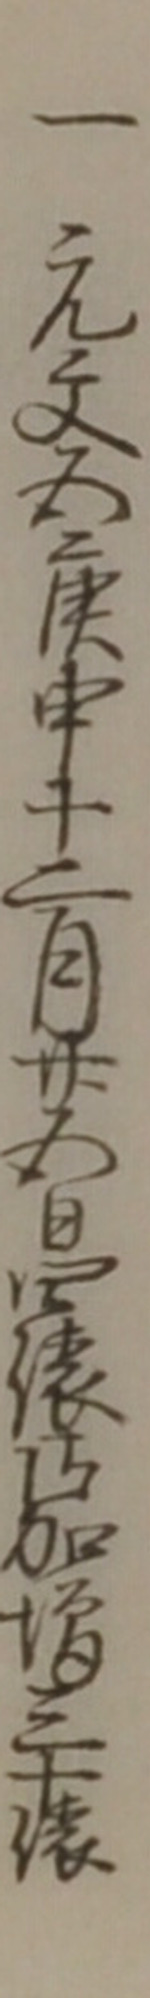一元文五庚申十二月廿五日四俵御加増三十俵
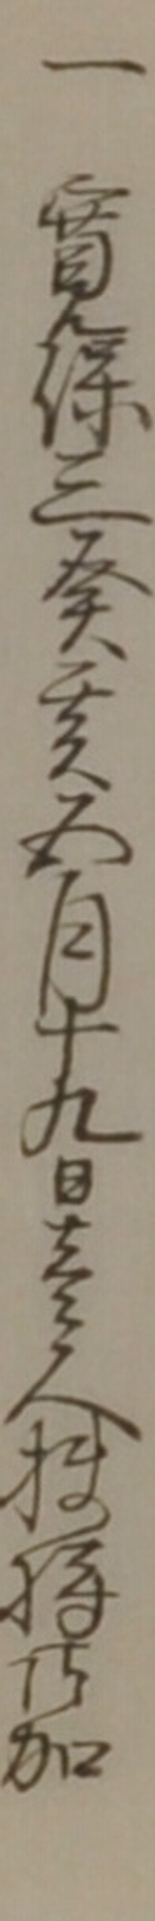一寛保三癸亥五月十九日壱人扶持御加
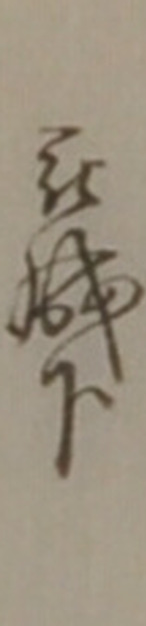被成下
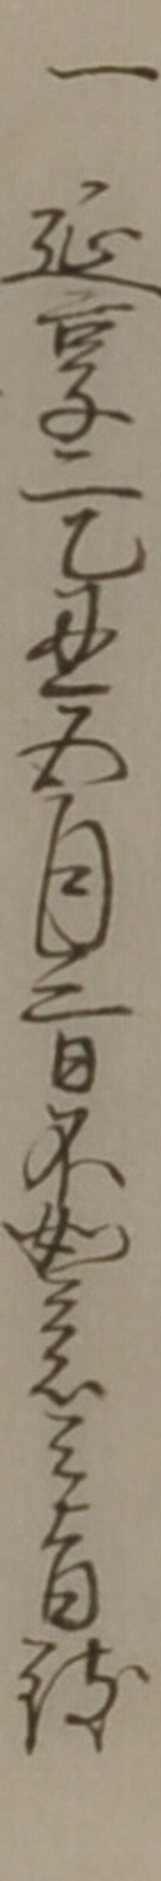一延享二乙丑五月三日不如意之旨致
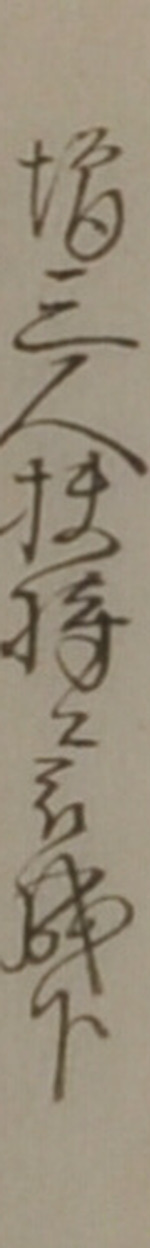増三人扶持ニ被下之
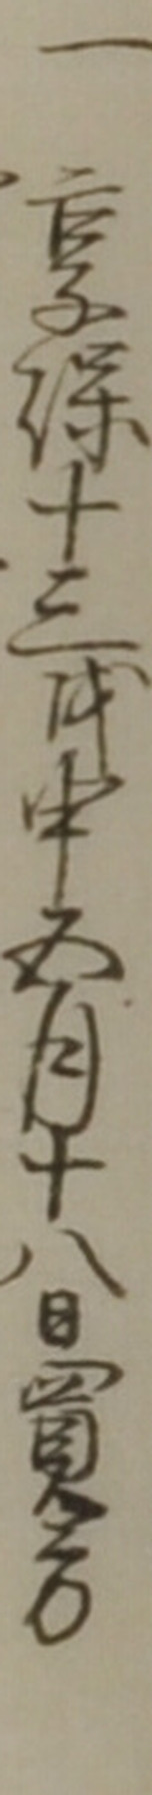一享保十三戊申五月十八日買方
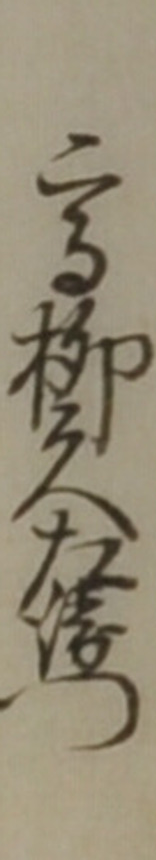高柳久左衛門
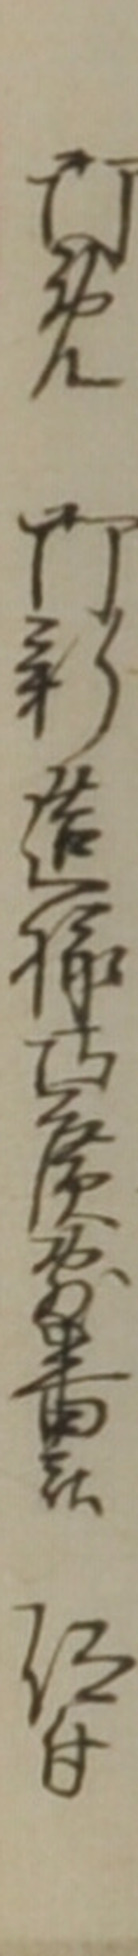御免御新造様御廣敷番被仰付
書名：無足廃家（壱）
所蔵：伊那市立高遠町図書館・合同会社AMANE
